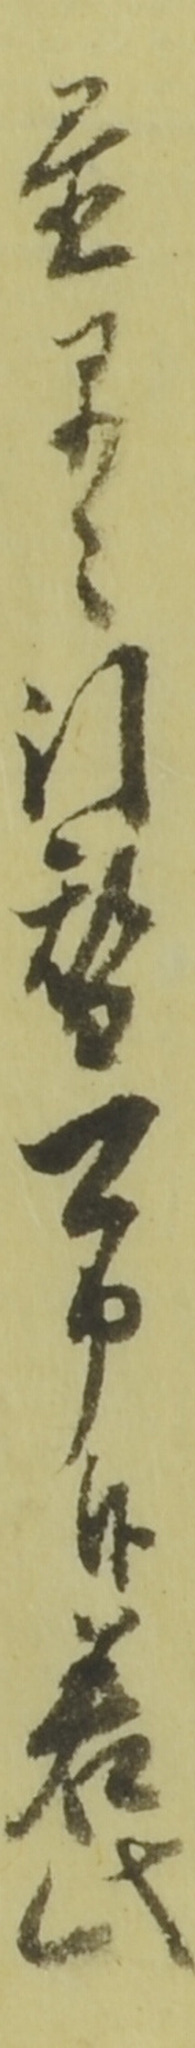置早々引替可申候若此
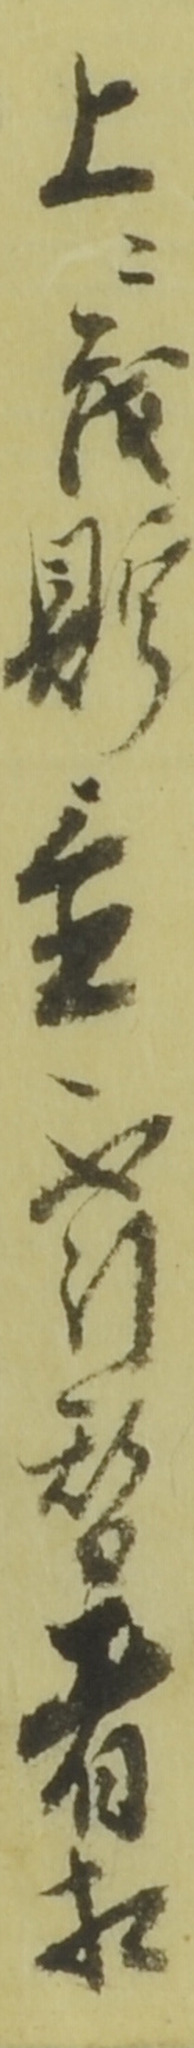上ニも貯置不引替者相
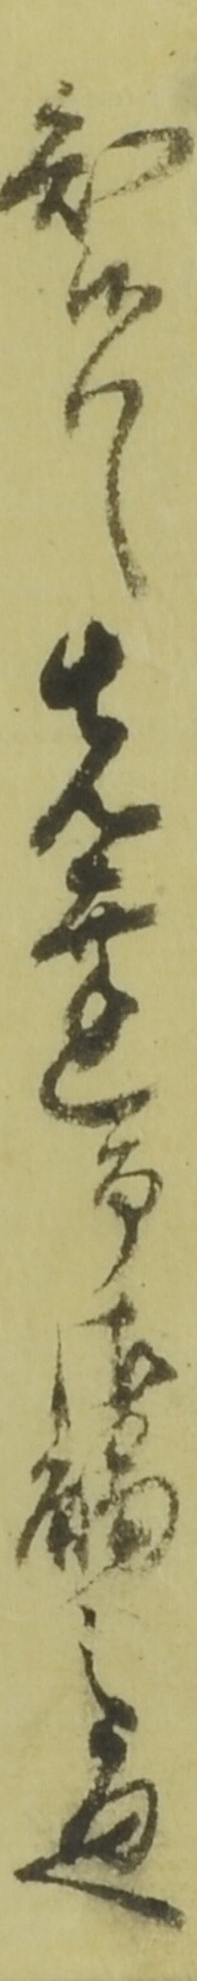知候ハヽ先達而御触之通
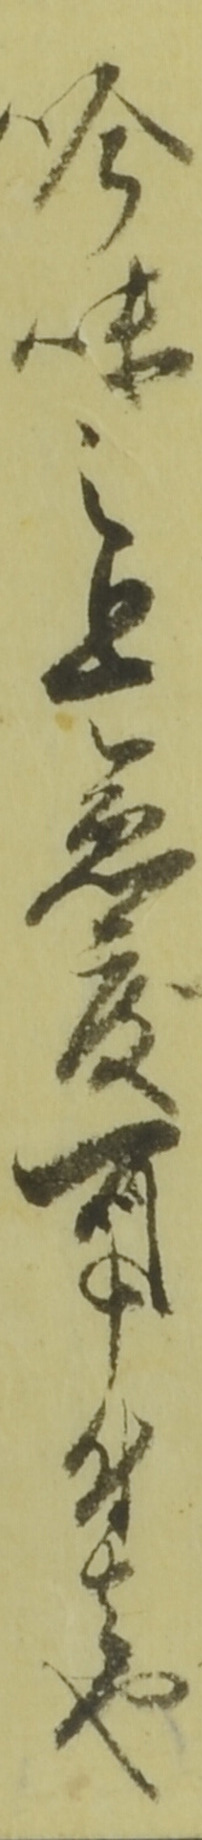吟味之上急度可申付者也
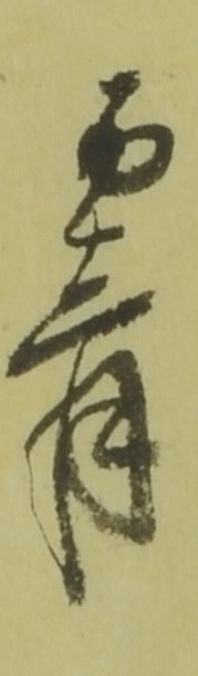酉十二月
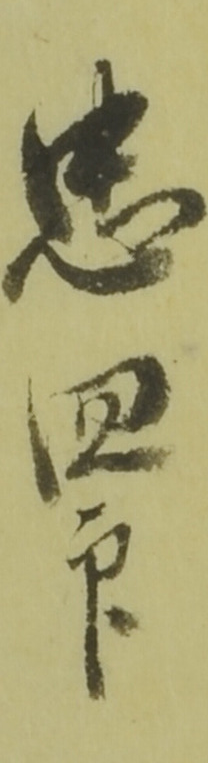忠四印
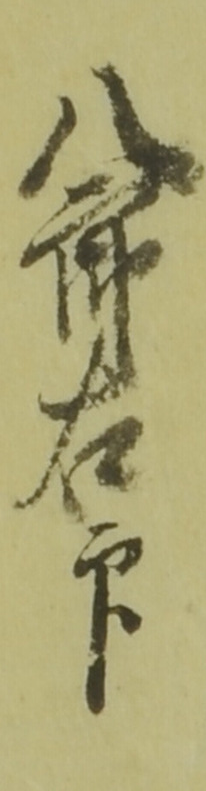八郎右印
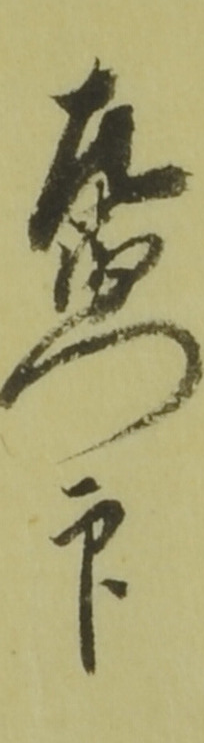左衛門印
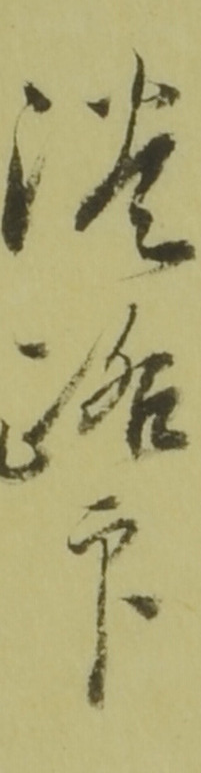淡路印
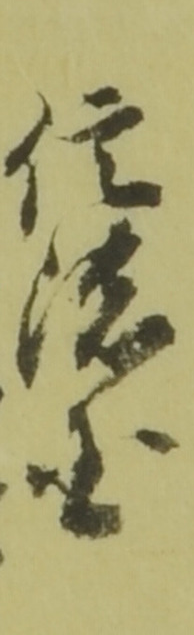信濃国
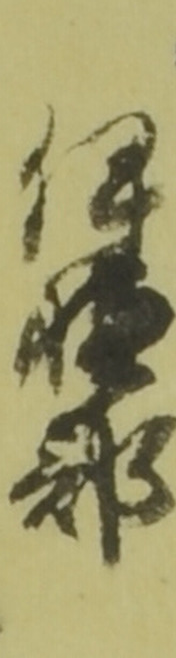伊那郡
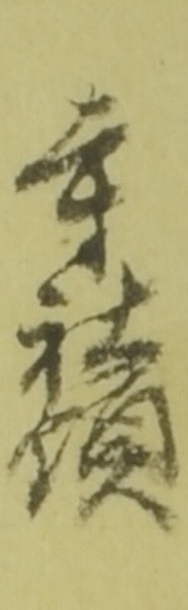寺社領

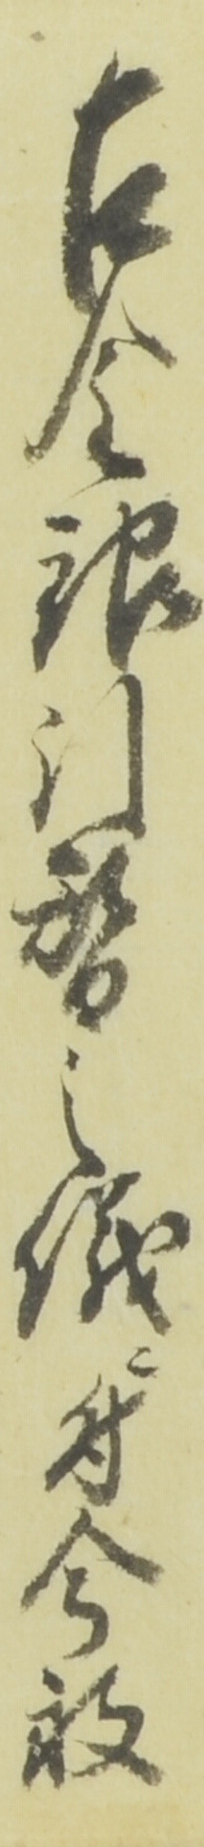右金銀引替之儀ニ付今般
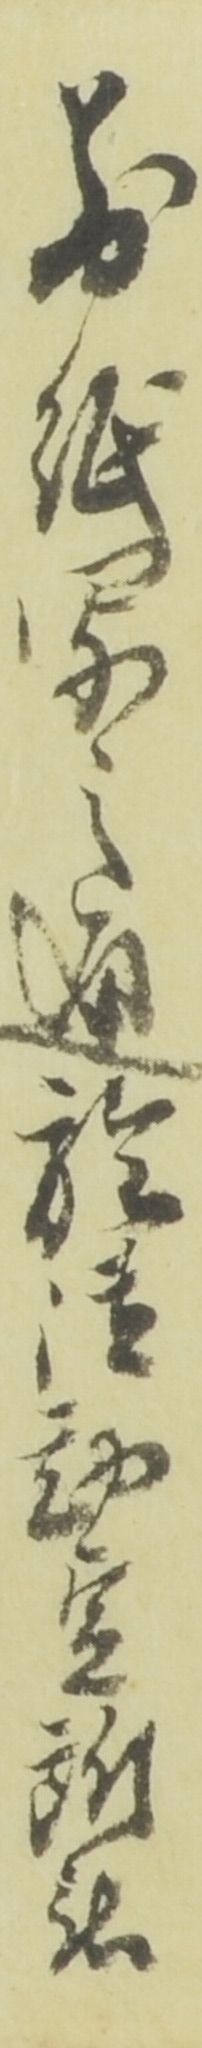別紙写之通於御勘定所被
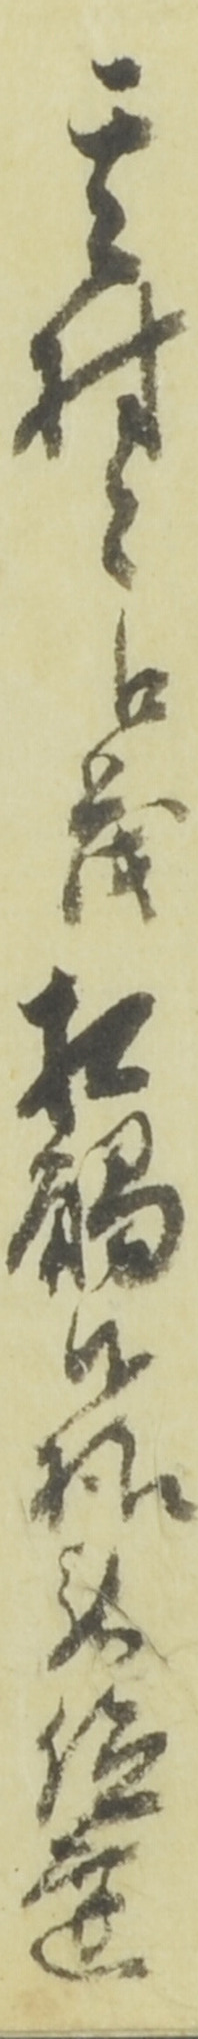其村々江も相触候様被仰達
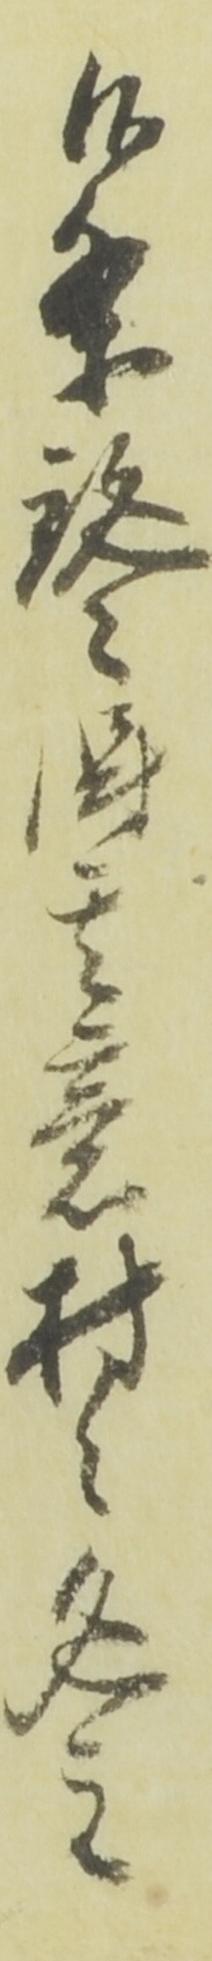候条銘々得其意村々名主
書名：御触書御書附控
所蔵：伊那市立高遠町図書館・合同会社AMANE
